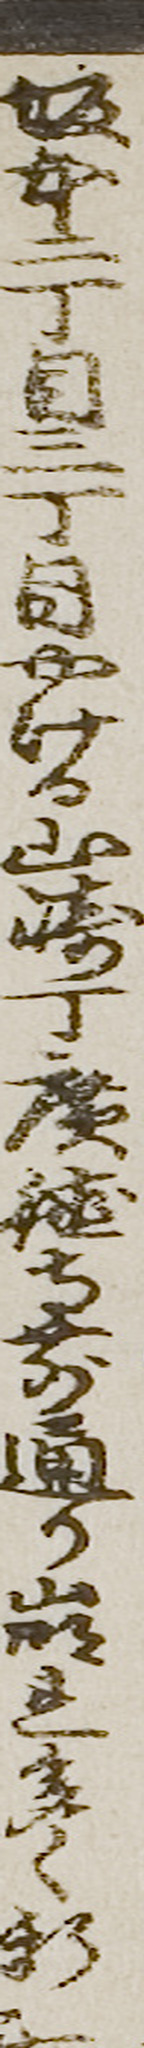坂本二丁目三丁目やける山崎丁広徳寺前通り崩れ多く新
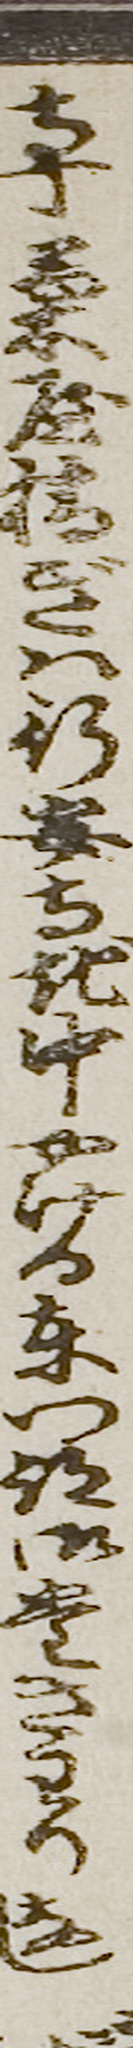寺丁菊屋橋ぎは行安寺地中やける東門跡御堂さわりなし
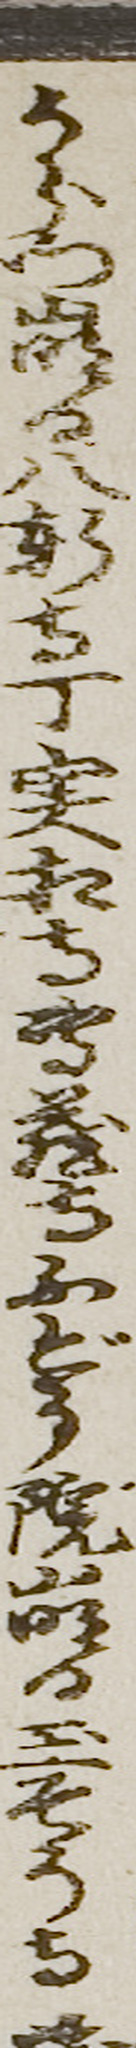うら門崩る八軒寺丁実相寺専蔵寺ふどう院崩る玉そう寺
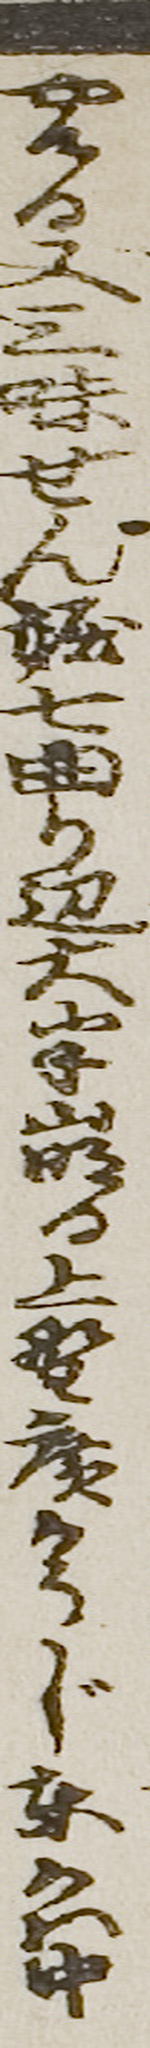やける又三味せん堀七曲り辺大半崩る上野広かうじ東かは中
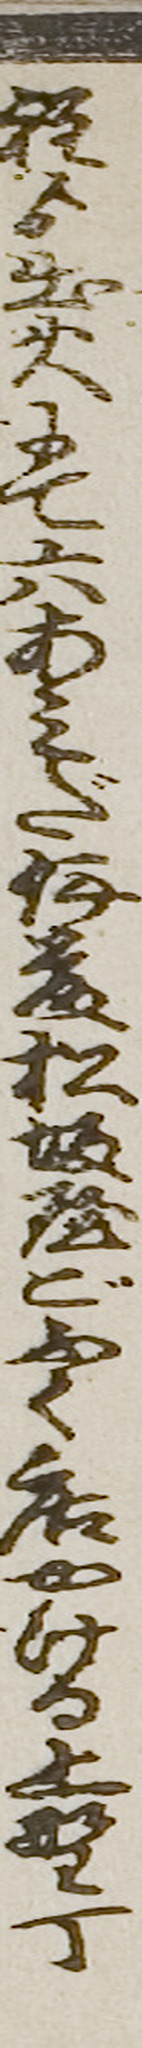程ゟ出火にて六あみだ伊藤松坂屋ごふく店やける上野丁
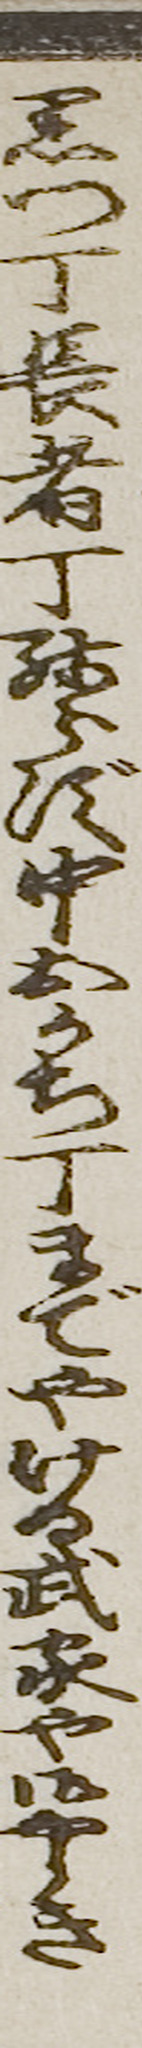黒門丁長者丁残らず中おかち丁までやける武家や御やしき
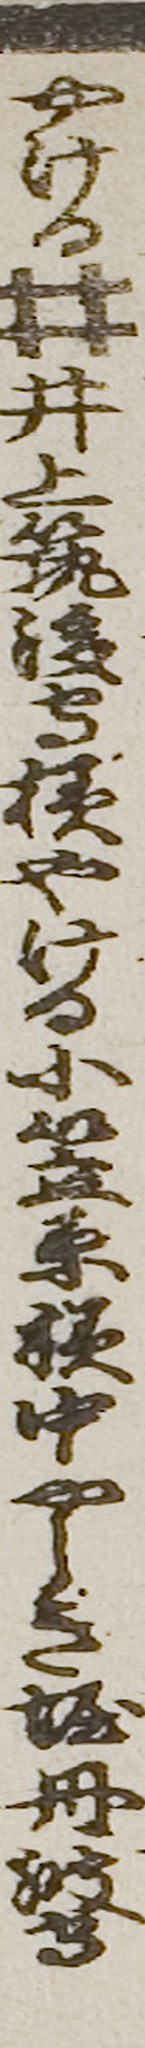やける〇井上筑後守様やける小笠原様中やしき堀丹波守
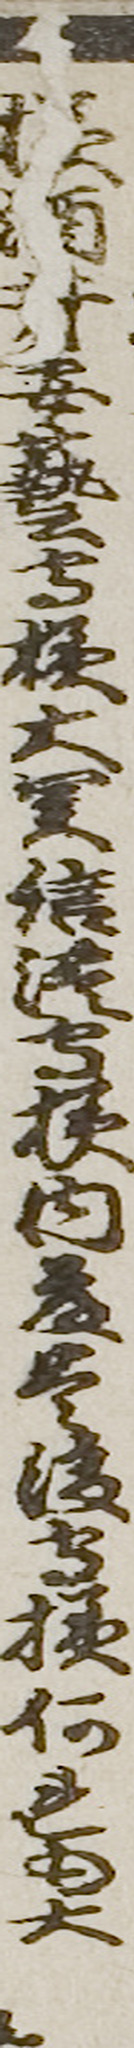様酒井安芸守様大関信濃守様内藤豊後守様何れも大
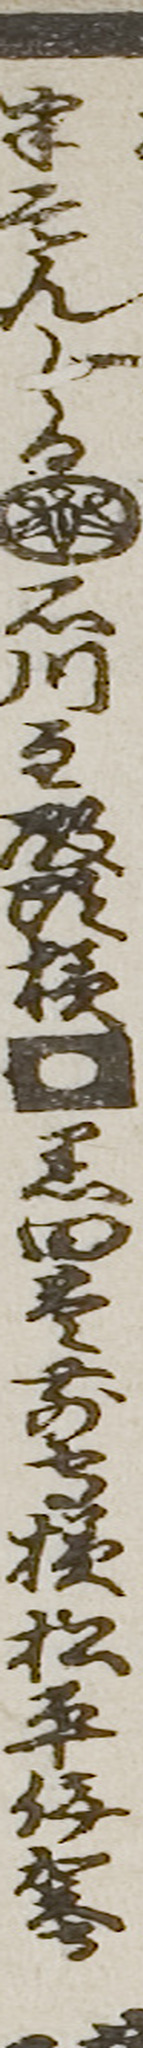半そんじる〇石川主殿頭様〇黒田豊前守様松平伊賀守
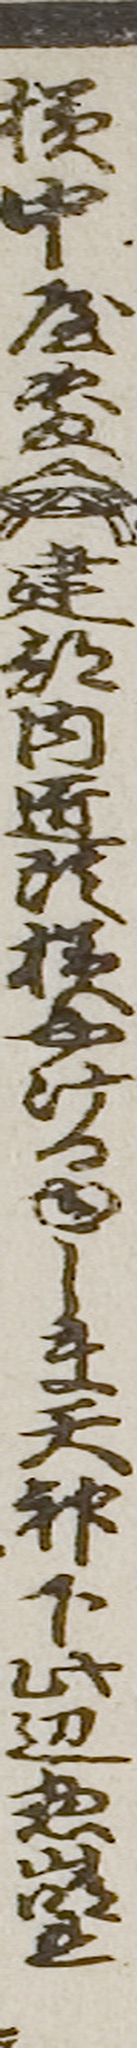様中屋敷〇建部内匠頭様やけるゆしま天神下此辺惣崩れ
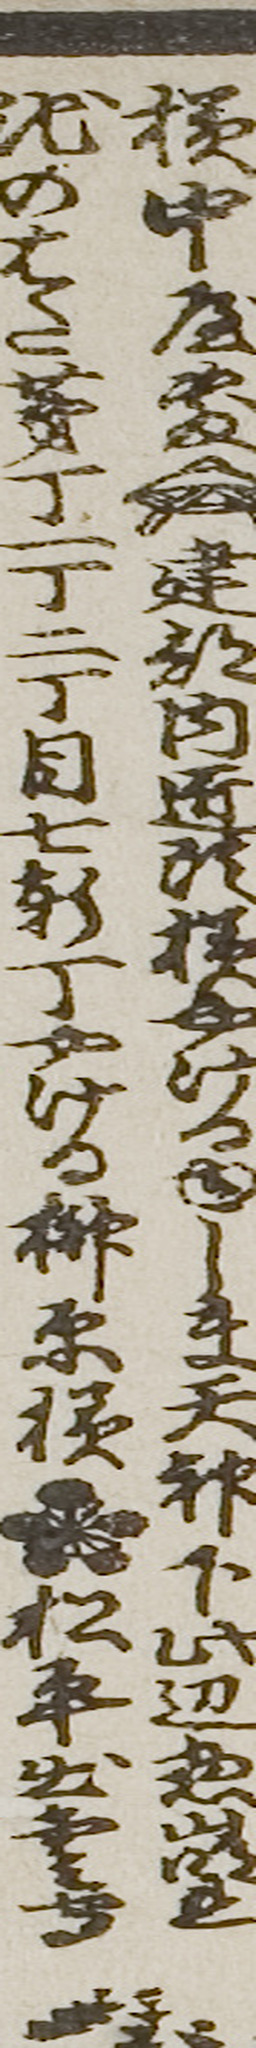池のはた茅丁一丁目二丁目七軒丁やける榊原様〇松平出雲守
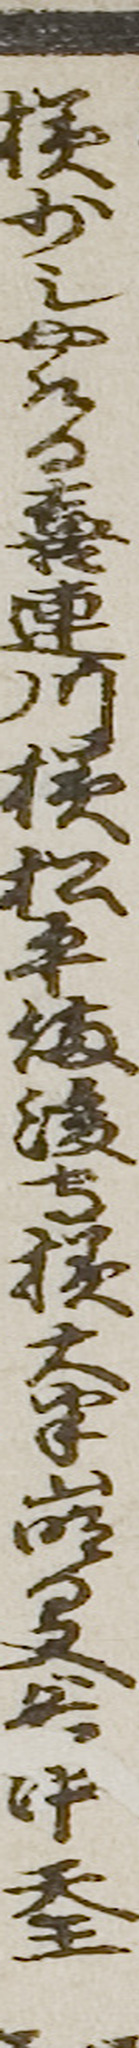様少シやける喜連川様松平備後守様大半崩る又谷中天王
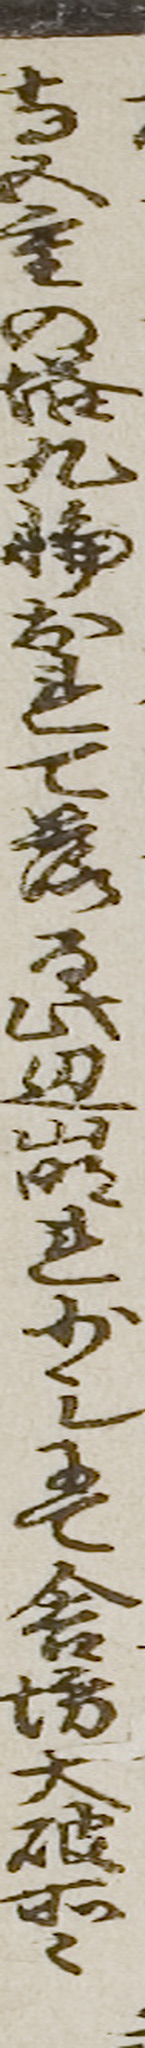寺五重の塔九輪おれて落る此辺崩れ少シにて舎坊大破所々
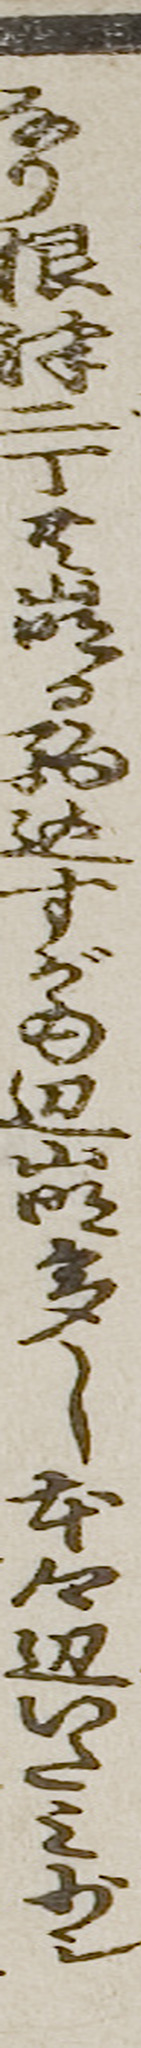なり根津二丁共崩る駒込すがも辺崩多し本郷辺いたみ少シ
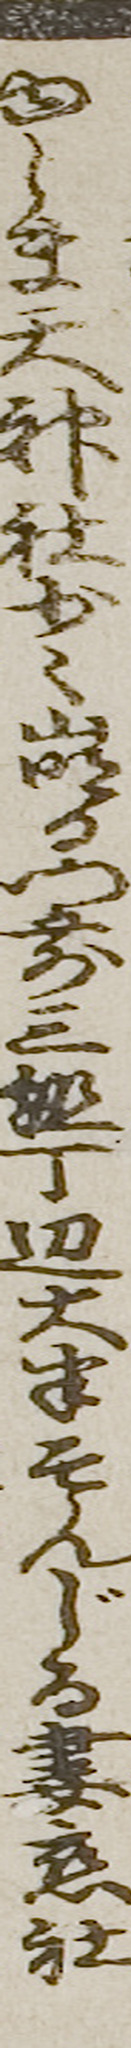ゆしま天神社少々崩る門前三組丁辺大半そんじる妻恋社
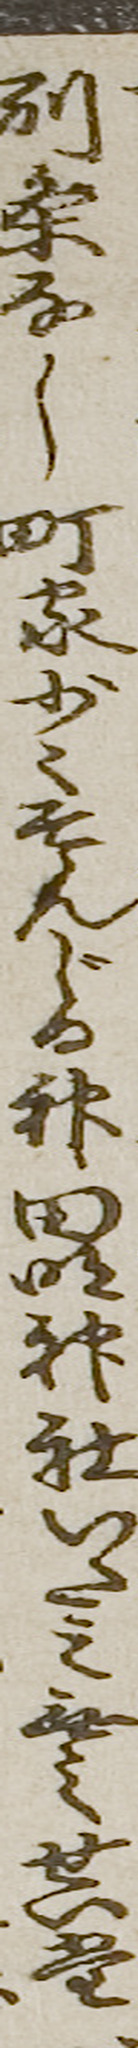別条なし町家少々そんじる神田明神社いたみ無之せい堂
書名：安政改正泰平盤石図会
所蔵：東京大学総合図書館 General Library in the University of Tokyo, JAPAN
